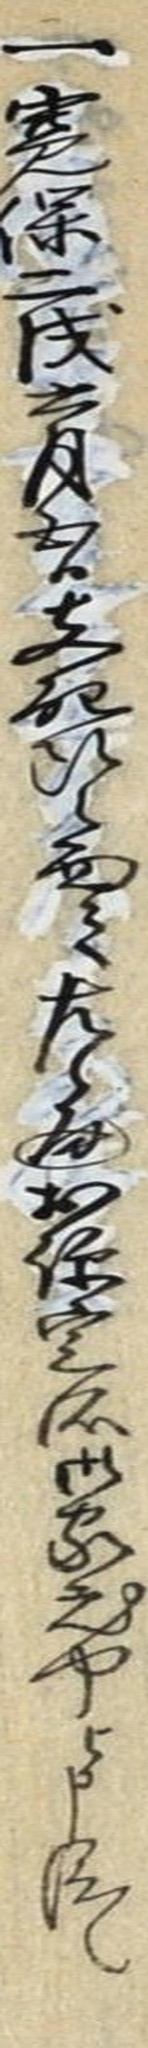一寛保二戌六月五日支配頭之面々へ左之通於評定所御家老中被申渡候
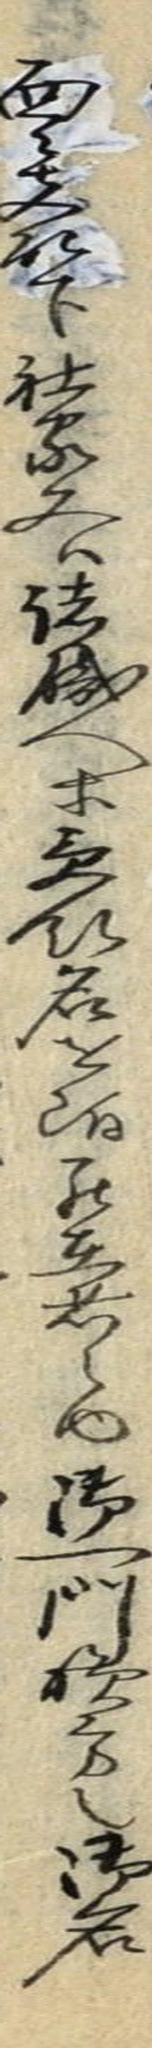面々支配下社家又は諸職人等受領名を附在在者之内御一門族方之御名
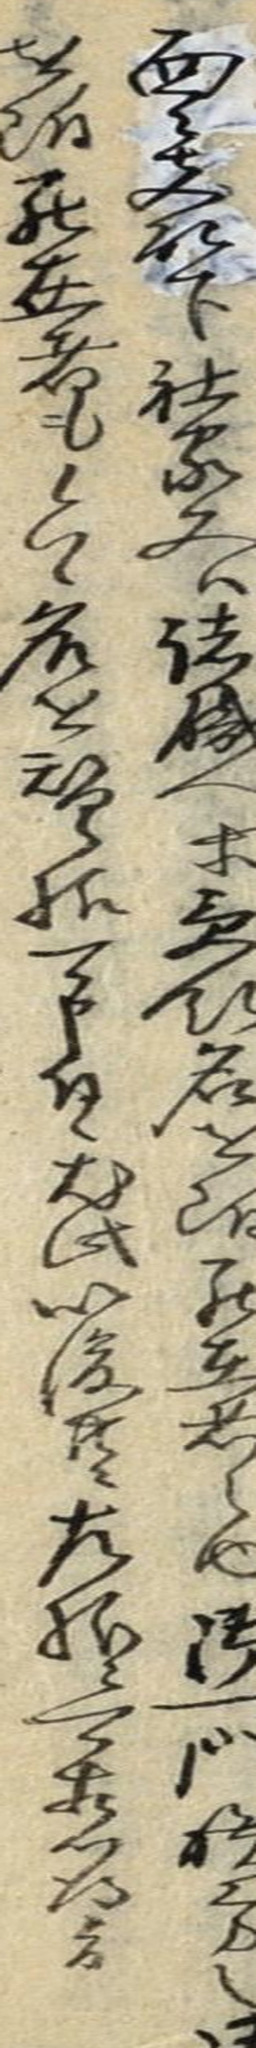を附罷在者も候はゝ名を替候様可申付候尤此以後共々左様に可相心得旨
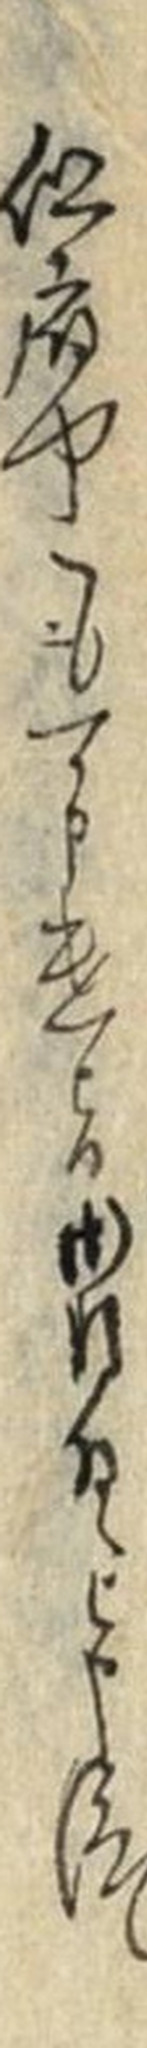但府中へも可申遣候旨御目付へ被申渡候
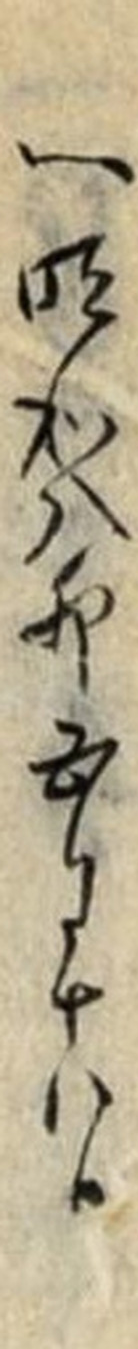一明和八卯五月十八日
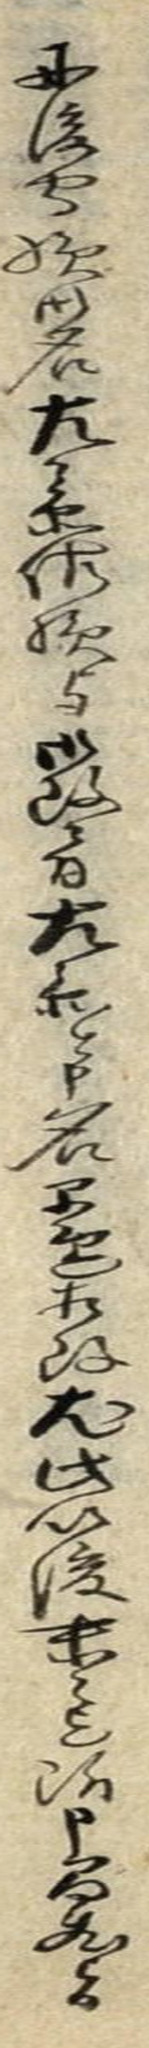丹後守様御名左兵衛佐様と御改に付左兵衛と申名早速相改尤以後末々迄附申間敷旨

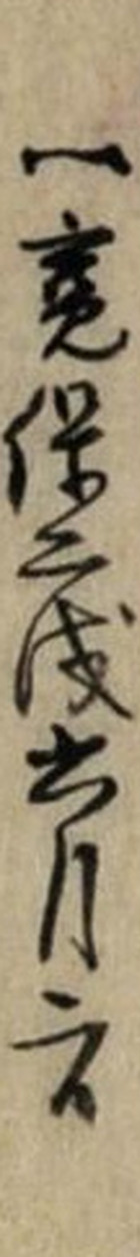寛保二戌六月二日
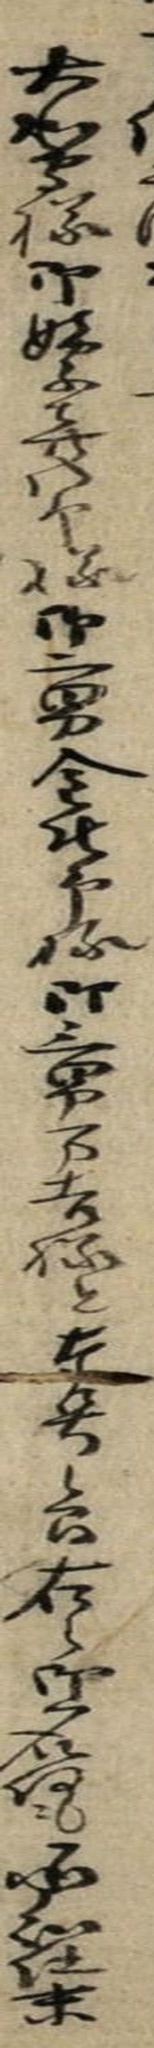大和守様御嫡子喜八郎様御二男金次郎様御三男万吉様と奉号候間右之御名何も承知仕末
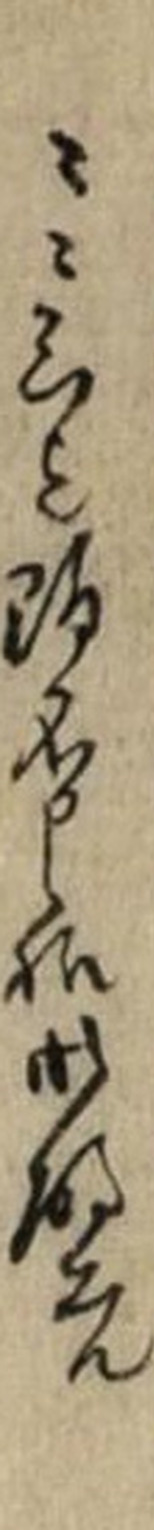々に至迄改名申候様御触出る
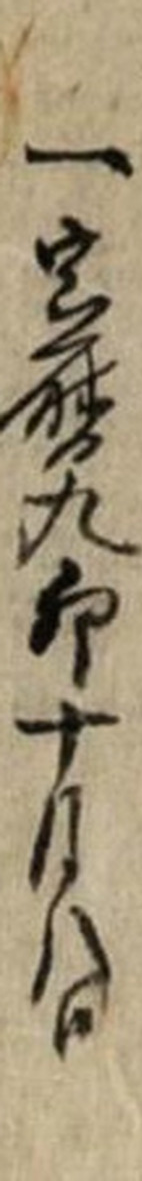一宝暦九卯十月八日
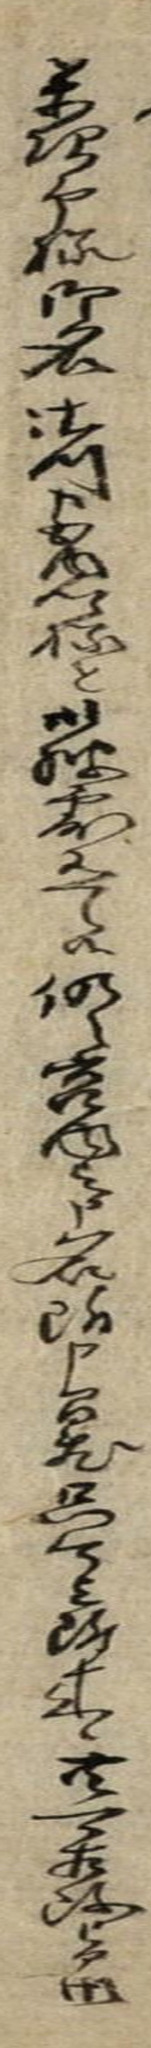萬次郎様御名清川宮内卿様と御披露有之候仍之宮内と申名附申間敷只今迄附来候共可相改旨御
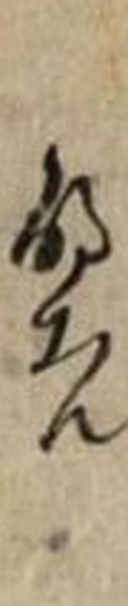触出る
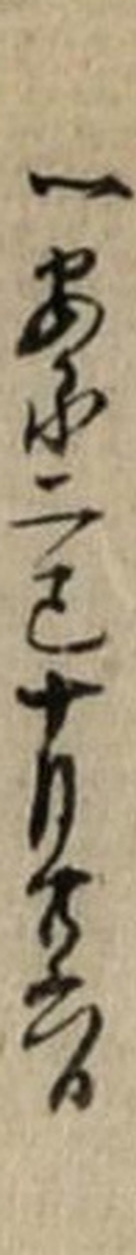一安永二巳十月廿六日
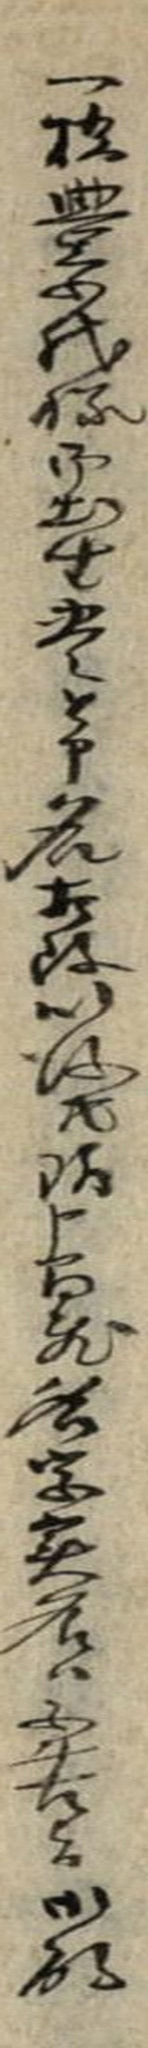一橋豊千代様御出生豊と申名相改以後共附申間敷名字実名は不苦旨御触
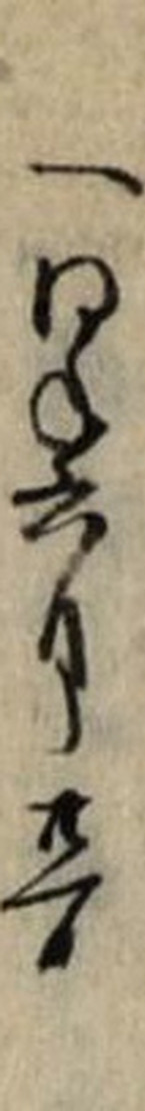一同年六月廿一日
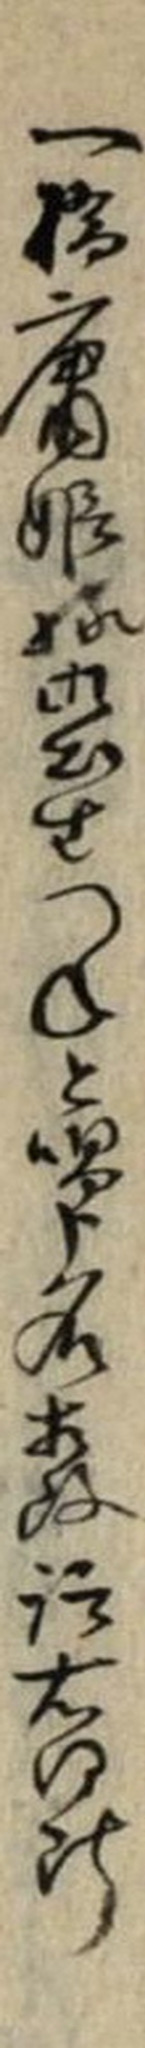一橋庸姫様御出生つねと唱申名相改跡右同断
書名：蒐輯之部
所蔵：福井県文書館 Fukui Prefectural Archives
